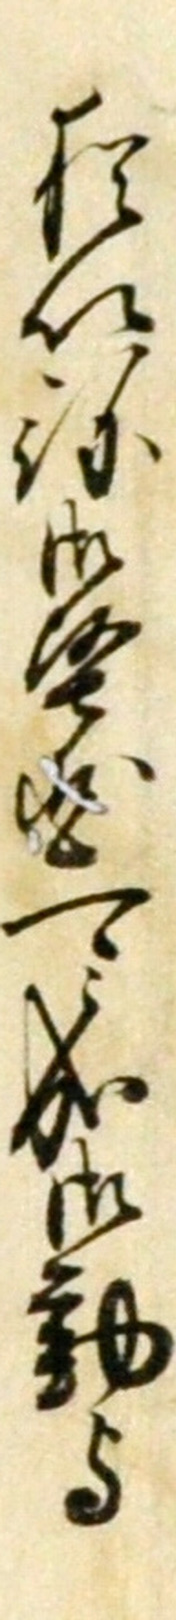猶以弥御堅固可被成御勤と
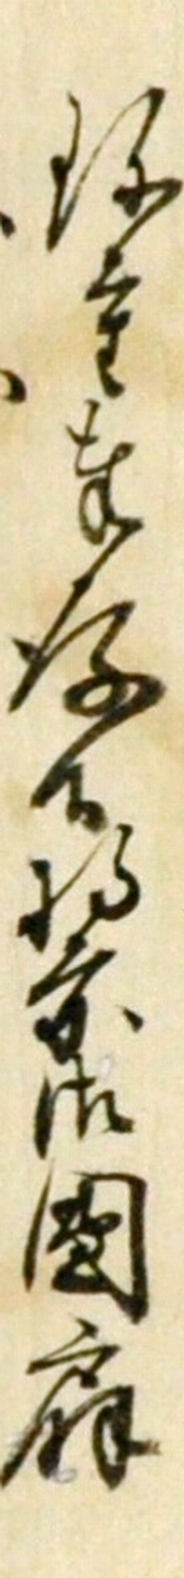珍重奉存候将亦御団扇
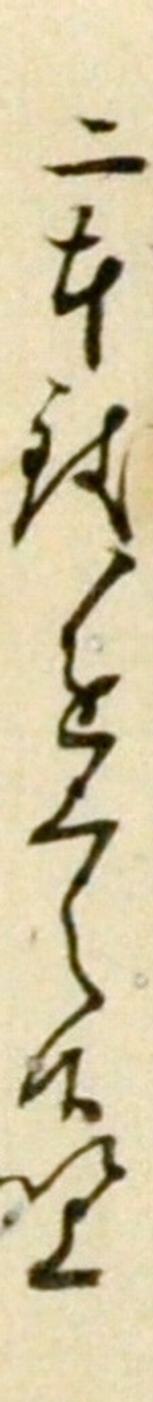二本致進上之候以上
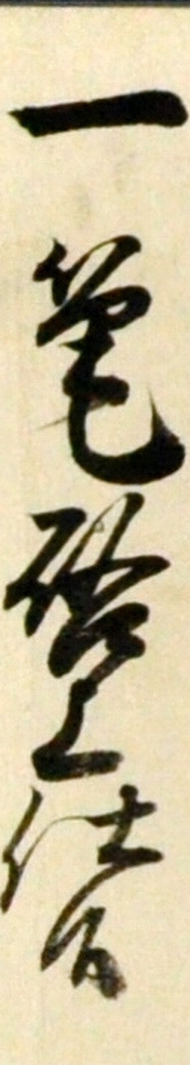一筆啓上仕候
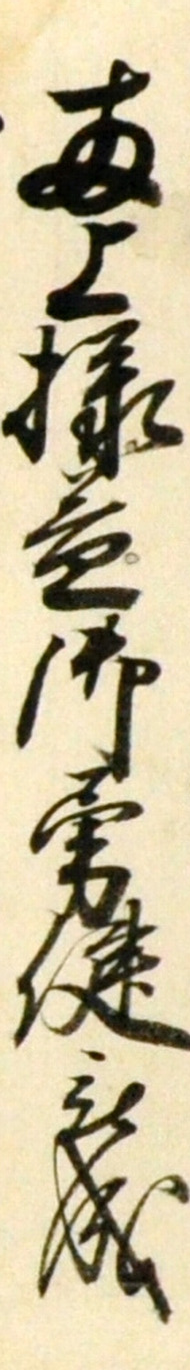両上様益御勇健被成
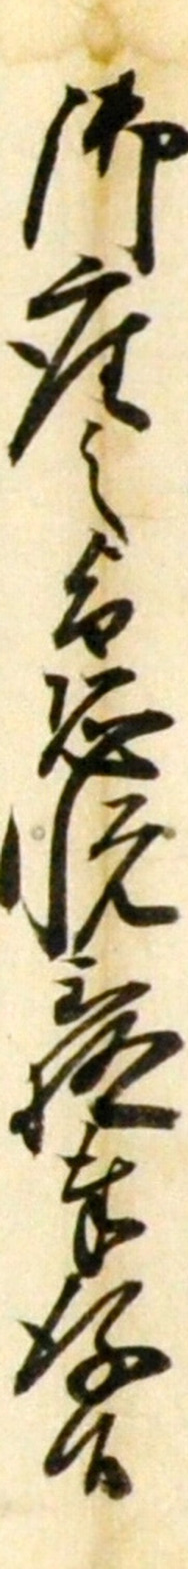御座之旨恐悦至極奉存候
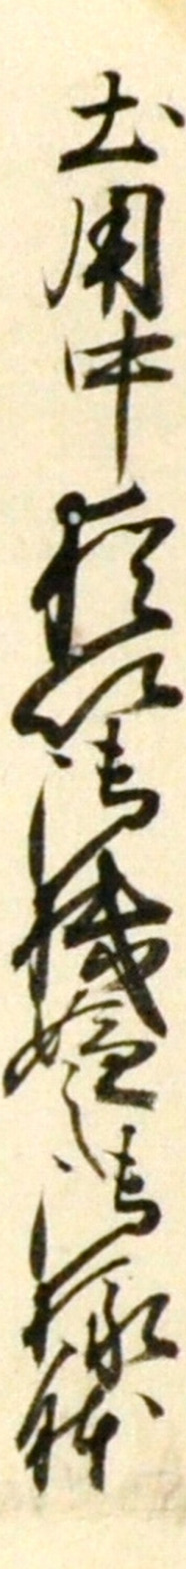土用中猶以御機嫌之御様体
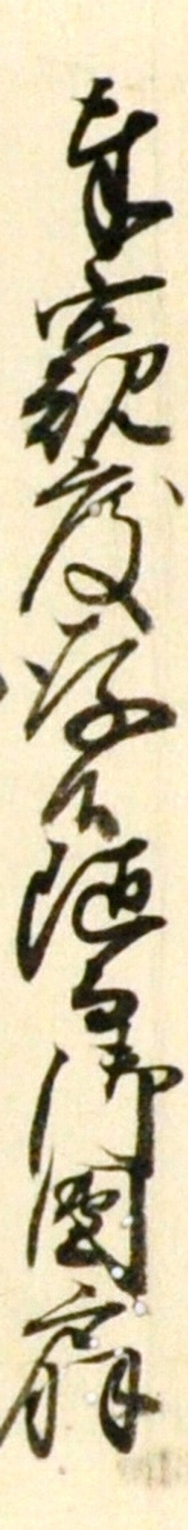奉窺度存候随而御団扇
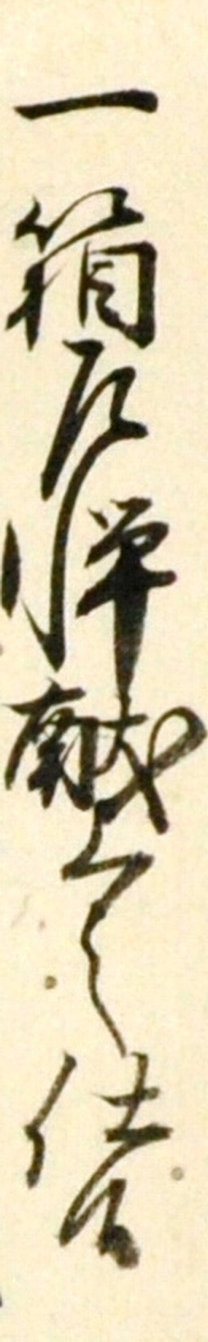一箱乍憚献上之仕候
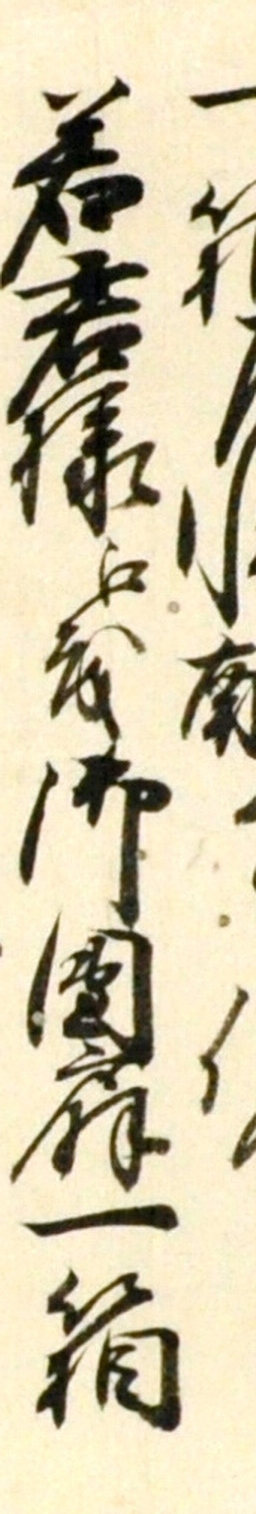若君様江茂御団扇一箱
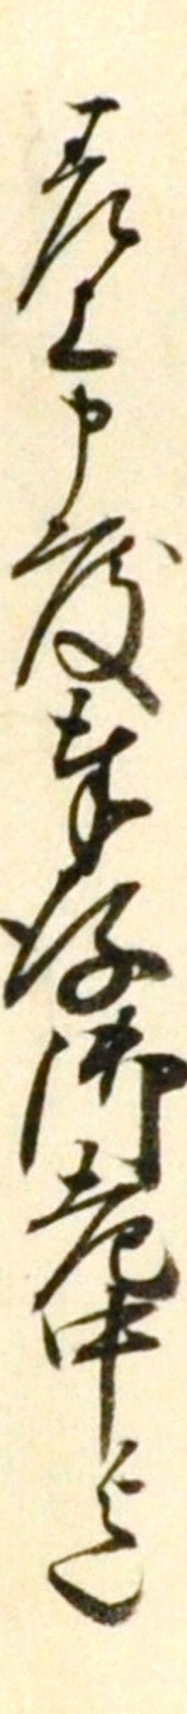差上申度奉存御老中迄
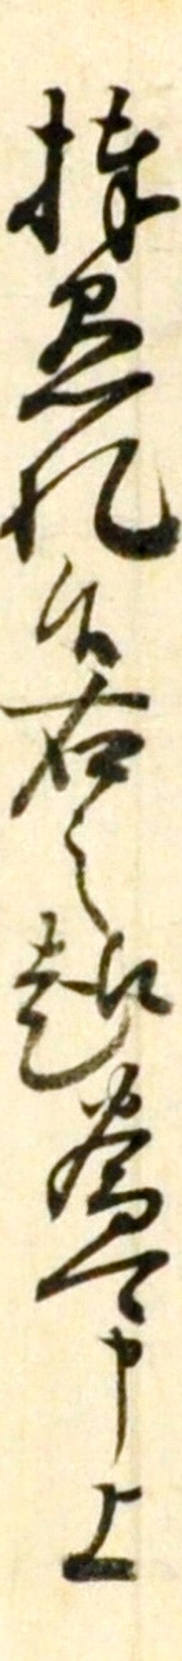捧愚札候右之趣為可申上
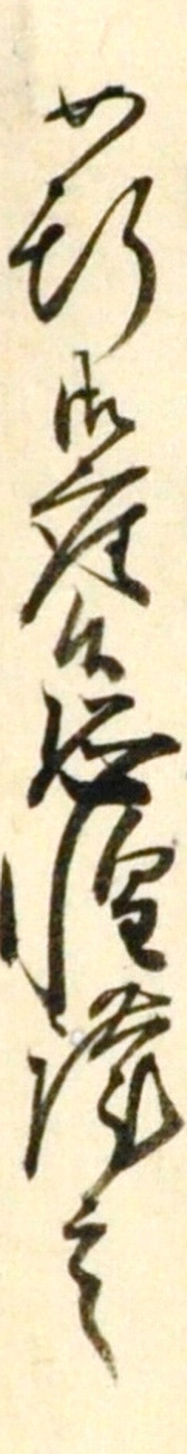如斯御座候恐惶謹言
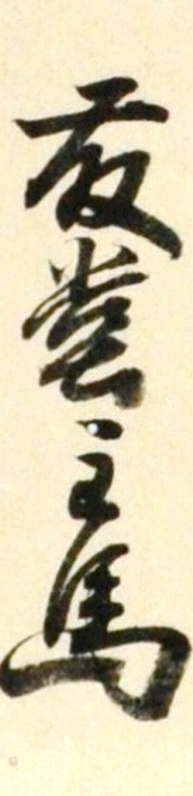藤堂主馬
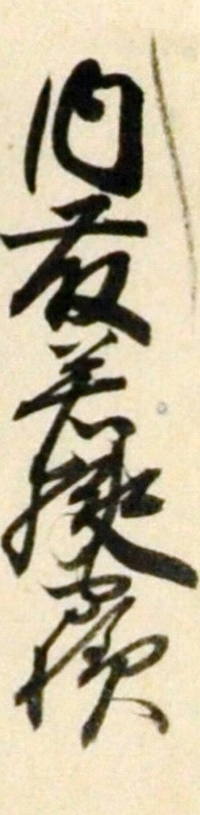内藤若狭守様
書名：書状
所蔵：伊那市立高遠町図書館・合同会社AMANE
